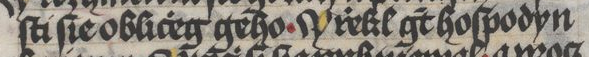ſtí ſie obliċeg geho.Y ṙekl ḡt hoſpodyn
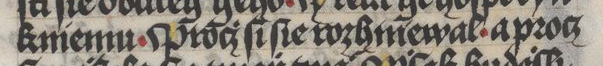kníemu.Procż ſi ſie rozhníewal.a procz
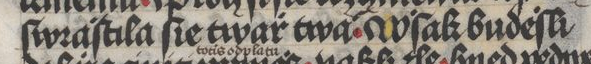ſwraẛtila ſie twaṙ twa?Wẛak budeẛli
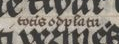totis odplatu
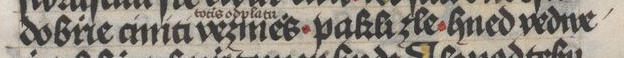dobṙie cínítí wezmeṡ.pakli zle.hned vedwe¬
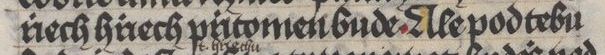ṙiech hṙiech pṙitomen bude. Ale pod tebu
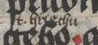t.hriechu
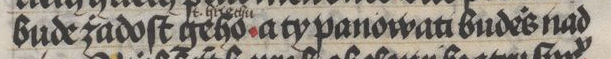bude żadoſt geho.a ty panowati budeṡ nad
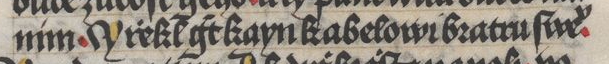ním.Y ṙekl ḡt kayn k abelowi bratru ſwev.
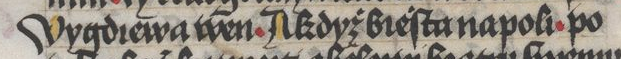Vygdiewa wen. Akdyż bieẛta napoli.po¬
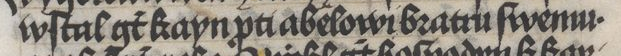wſtal ḡt kayn ꝓti abelowi bratru ſwemu.
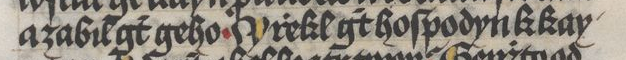a zabil ḡt geho.Y ṙekl ḡt hoſpodyn k kay¬
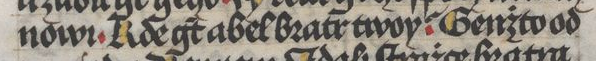nowi. Kde ḡt abel bratr twoy? Genżto od¬
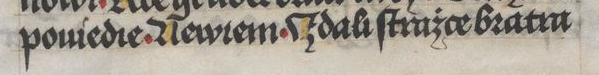pouiedie.Newiem.Zdali ſtrażce bratra
